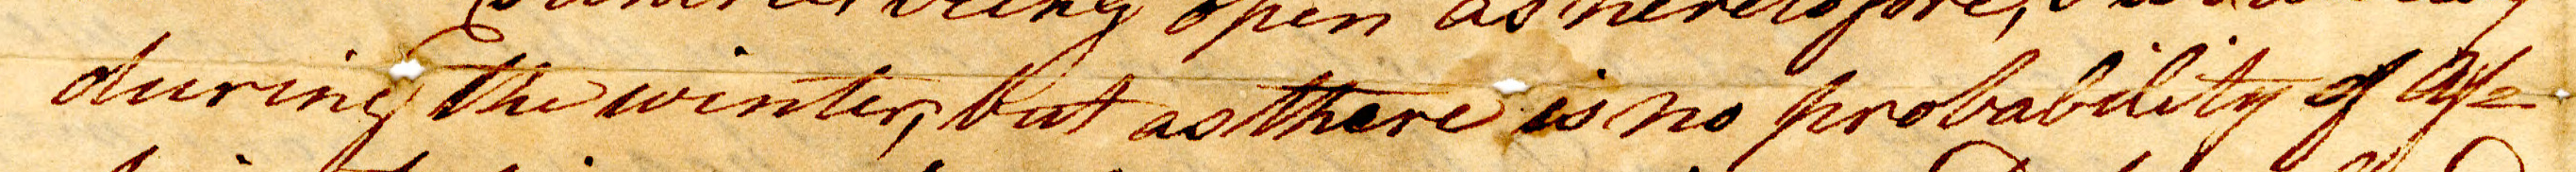during the winter, but as there is no probability of Af-
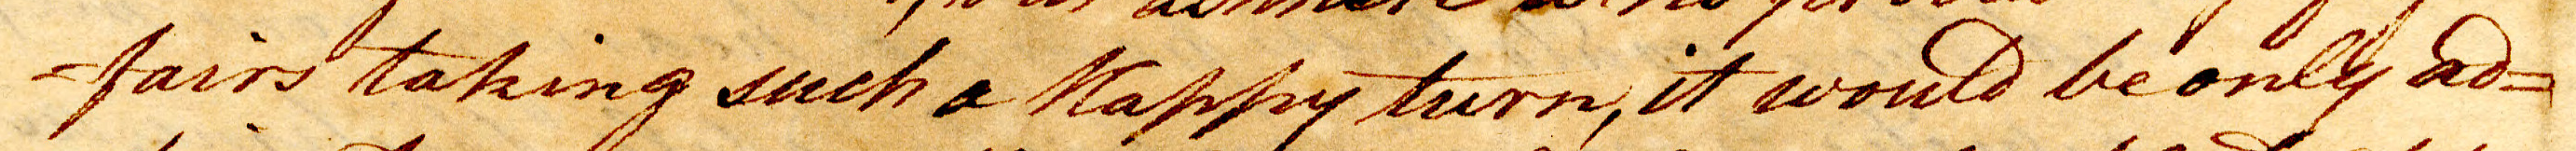-fairs taking such a Happy turn, it would be only ad-
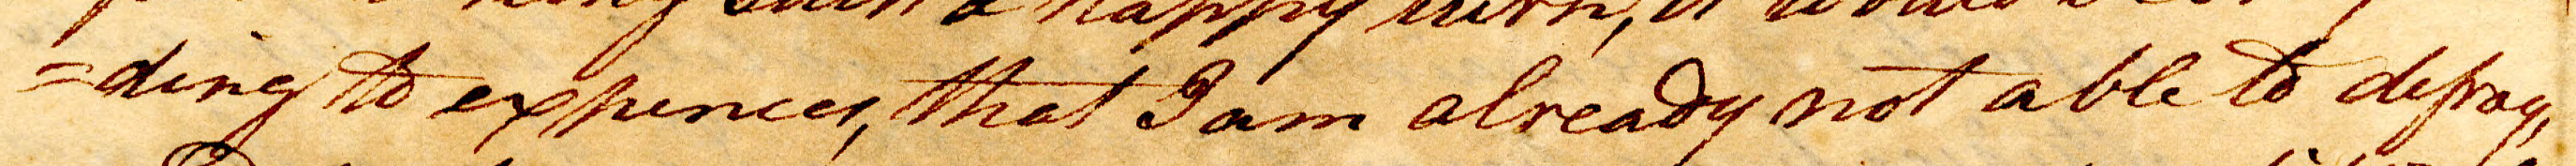-ding to expences, that I am already not able to defray
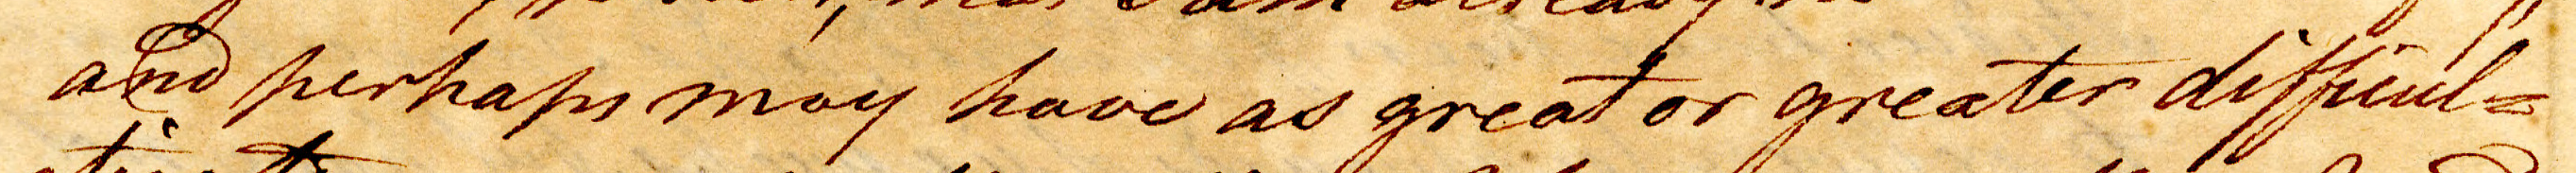and perhaps may have as great or greater difficul-
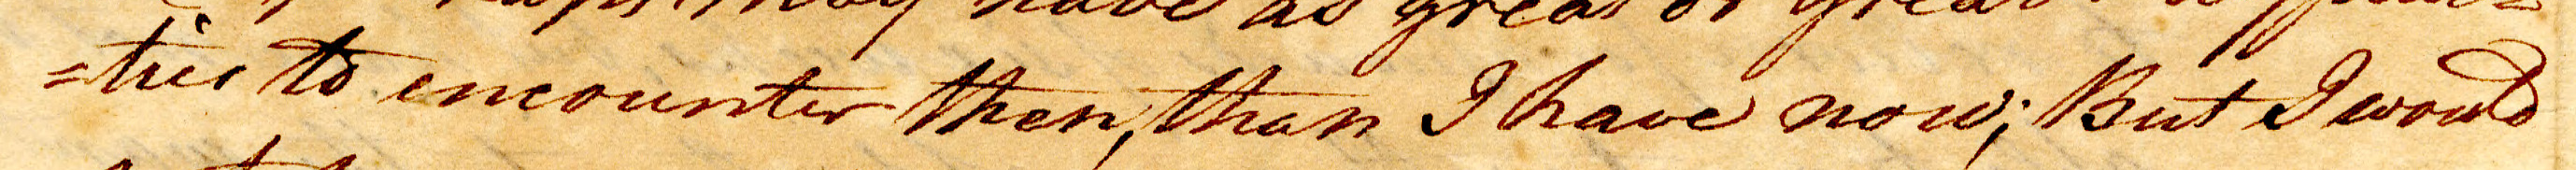-ties to encounter then, than I have now; But I would
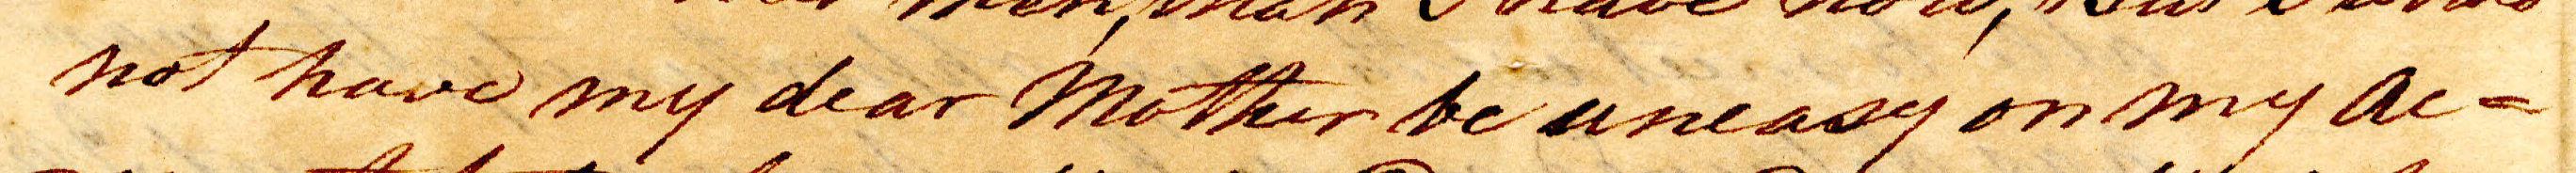not have my dear Mother be uneasy on my Ac-
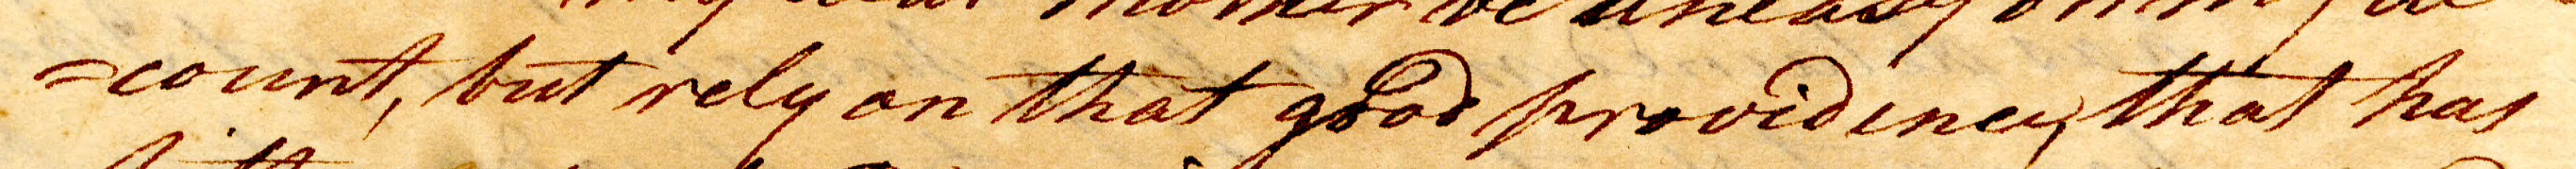-count, but rely on that good providence, that has
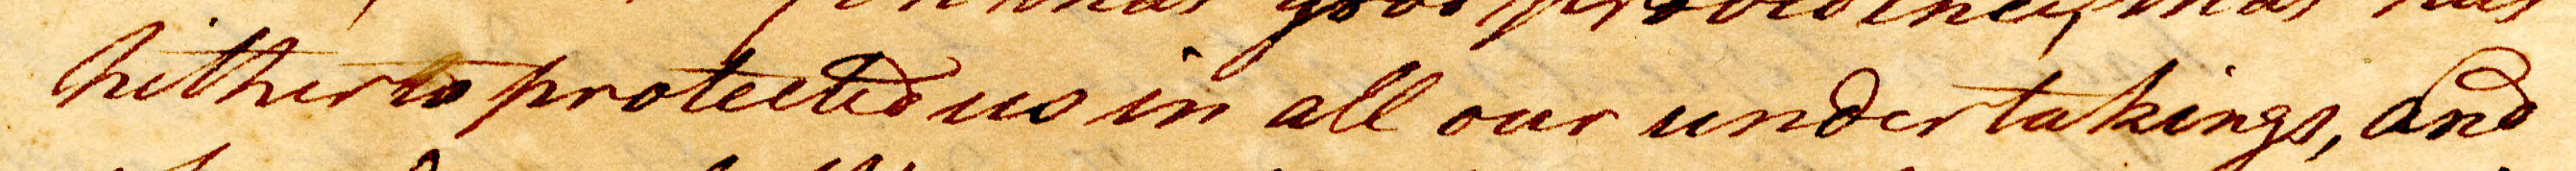hitherto protected us in all our undertakings, and
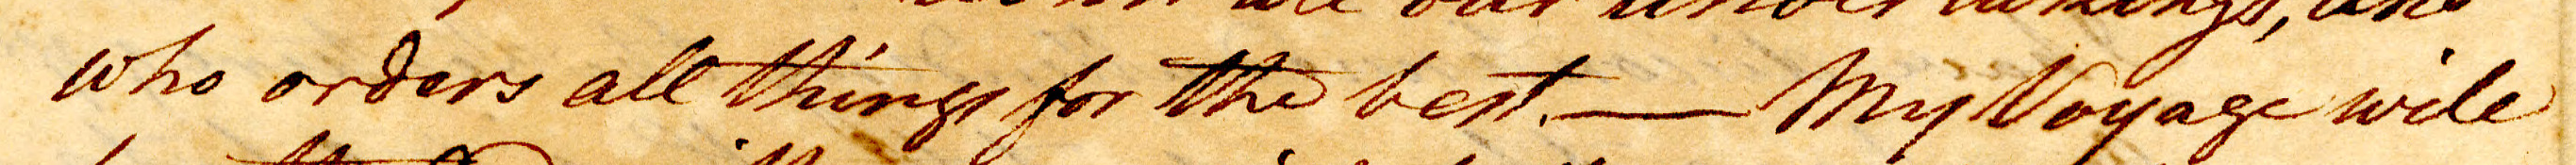who orders all things for the best.- My Voyage will
